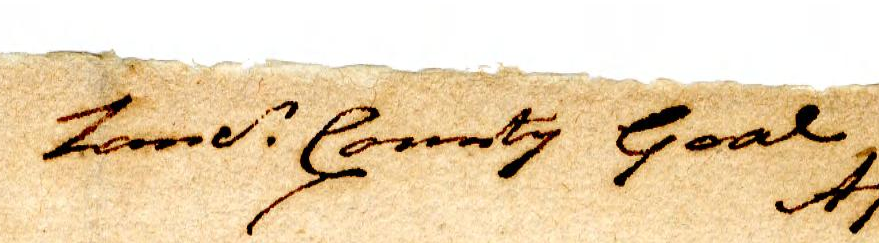Lanc^r. County Goal
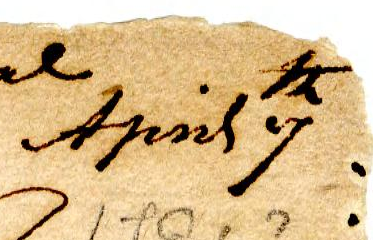April 7^th
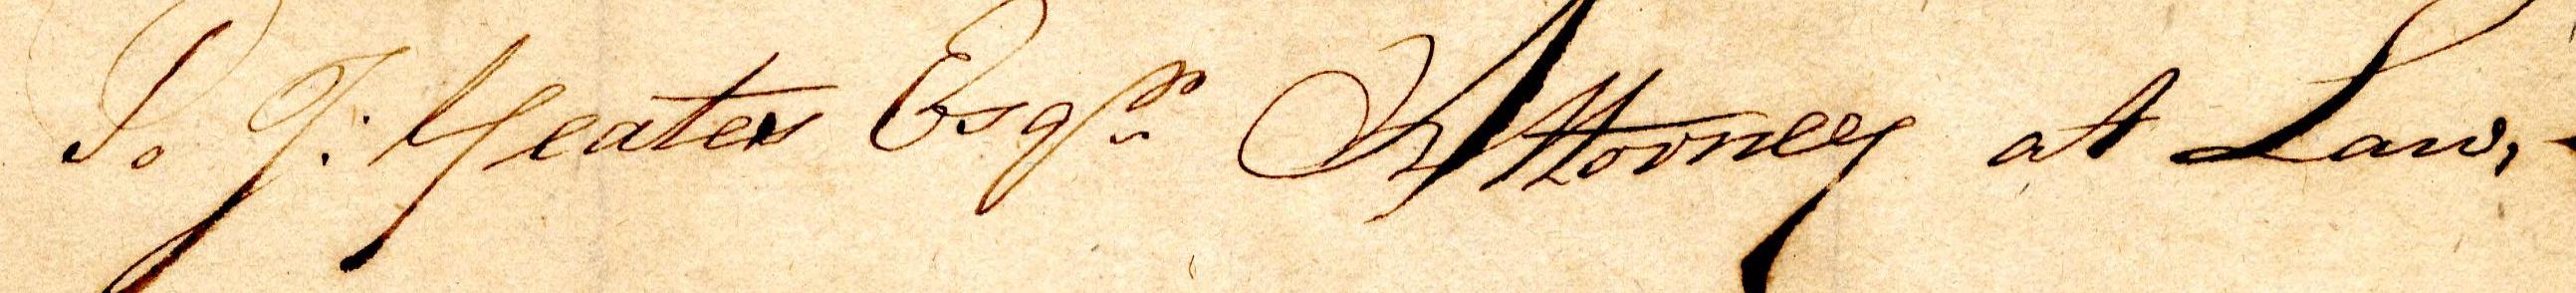To J. Yeates Esq^r Attorney at Law,
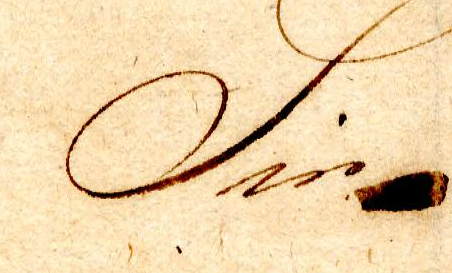Sir
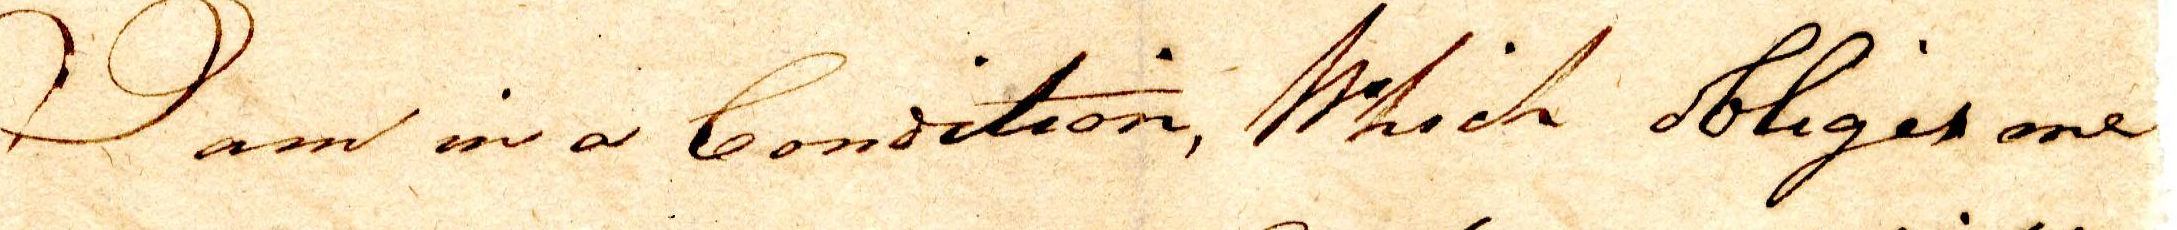I am in a Condition, Which obliges one
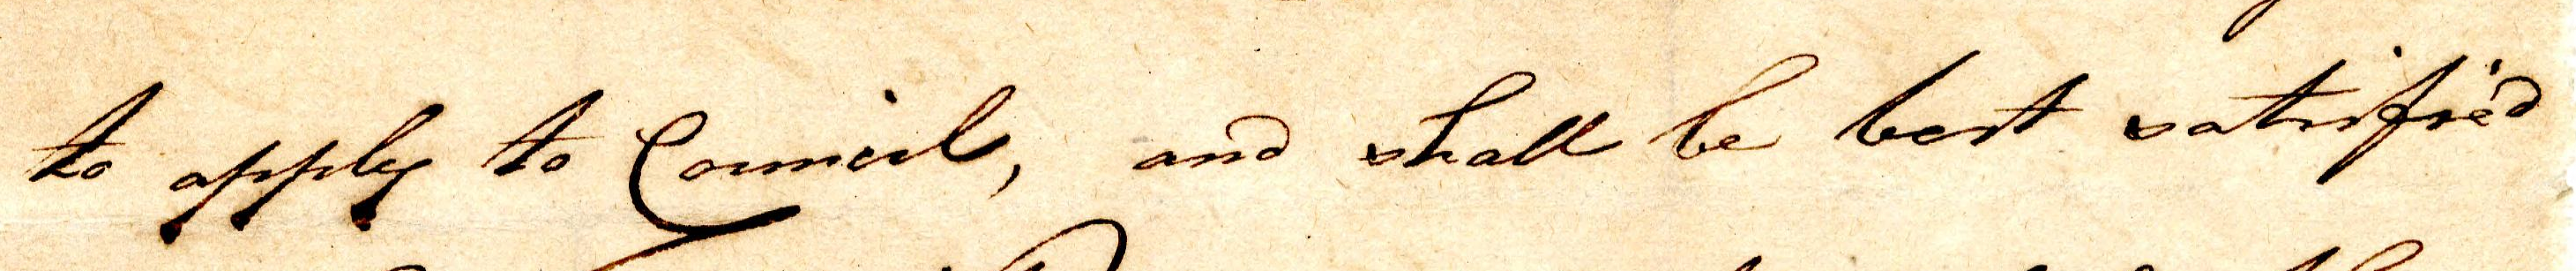to apply to Council, and shall be best satisfied
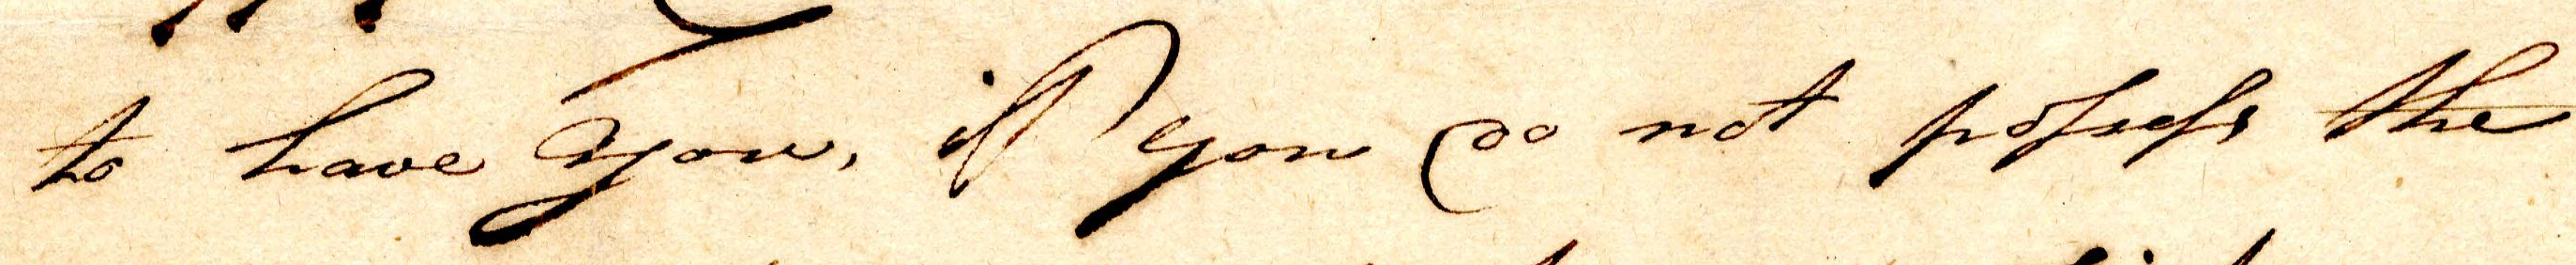to have you, if you do not possess the
